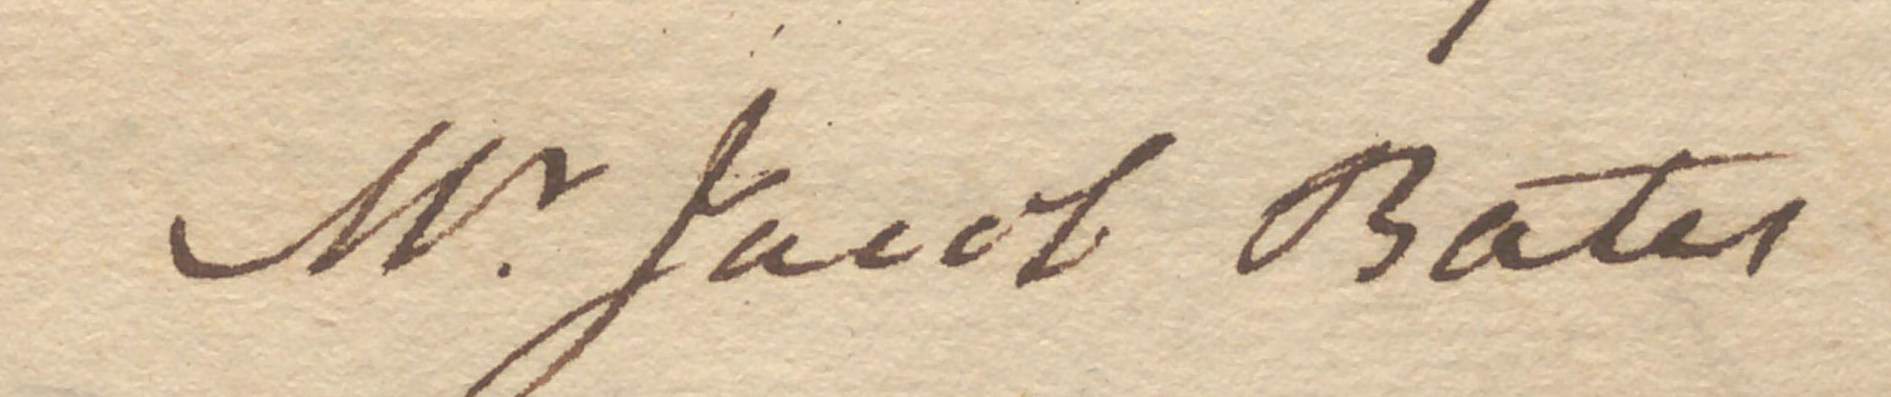M^r. Jacob Bates
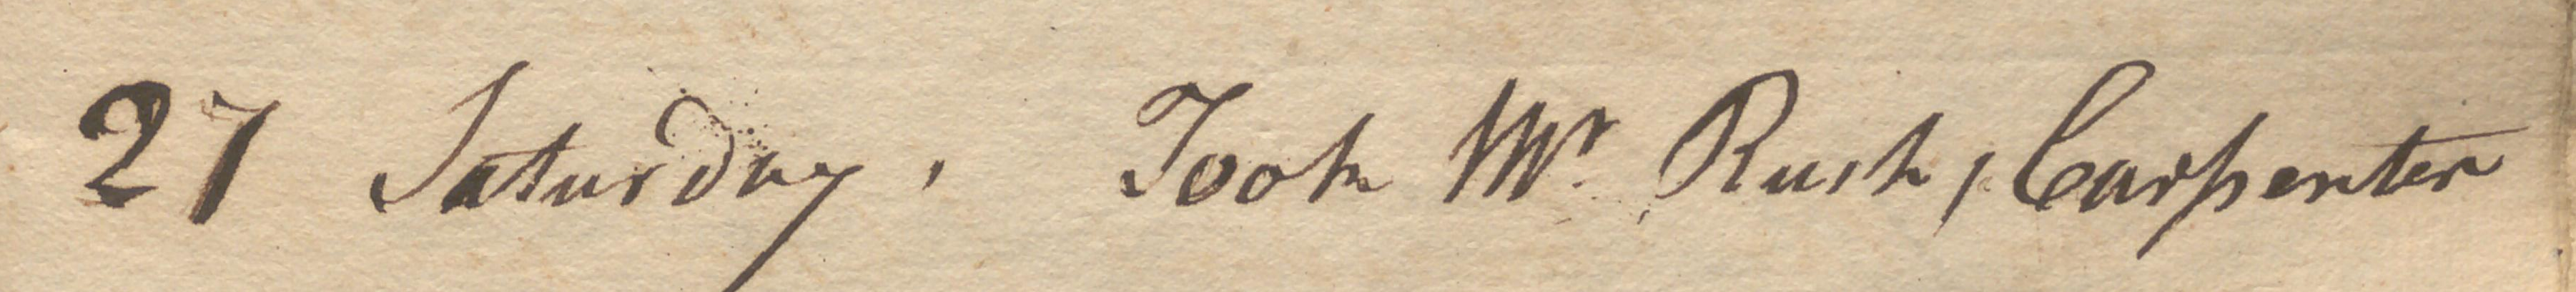27 Saturday. Took M^r. Rush, Carpenter
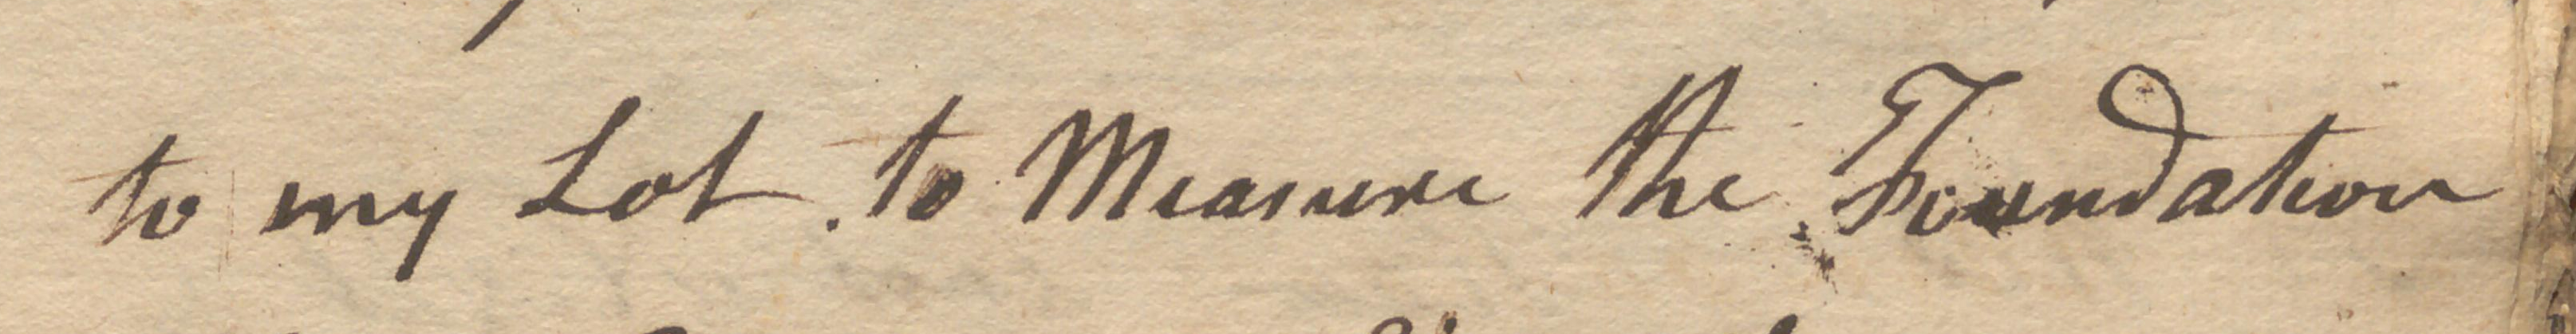to my Lot to Measure the Foundation
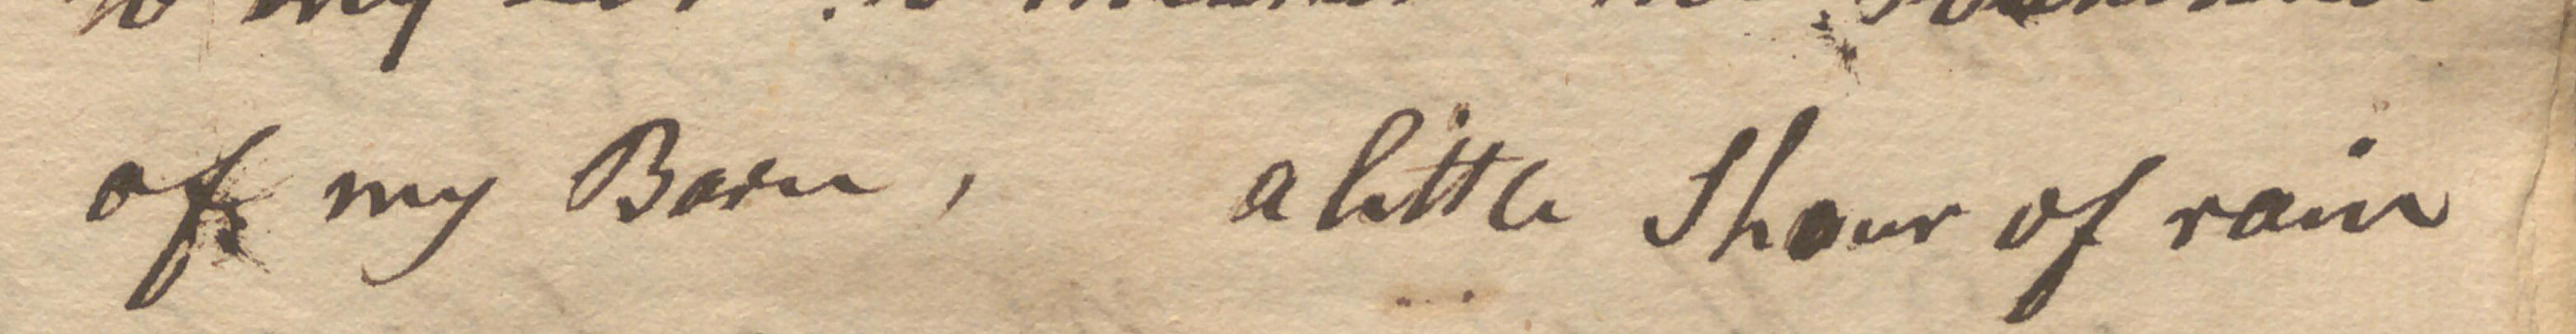of my Barn, a little Shour of rain
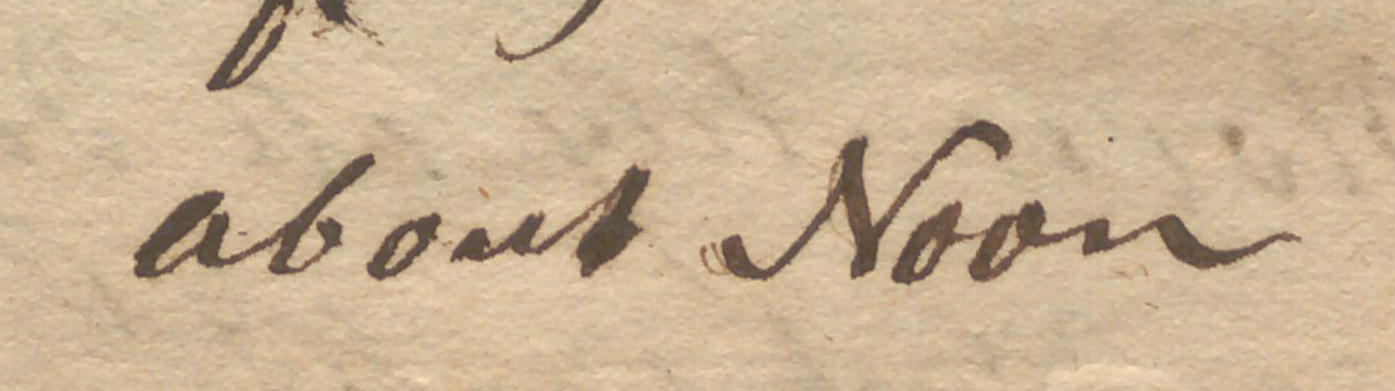about Noon
